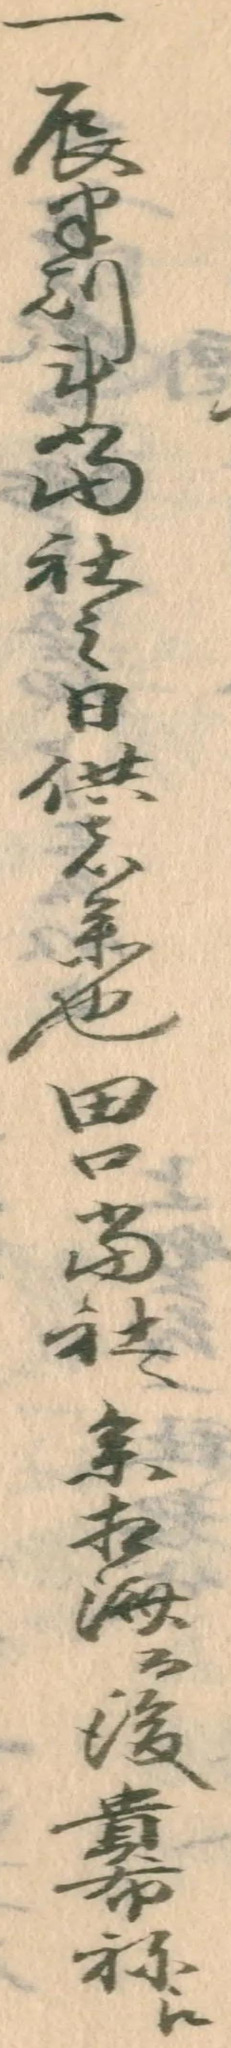一辰半刻計当社之日供は参也田口当社へ参相済而後貴布祢江
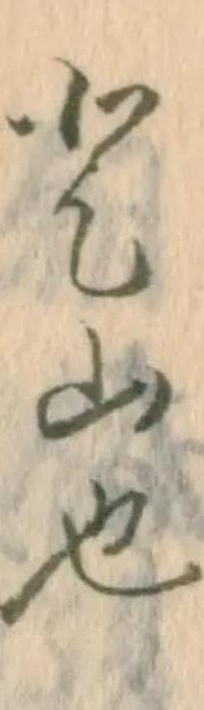登山也
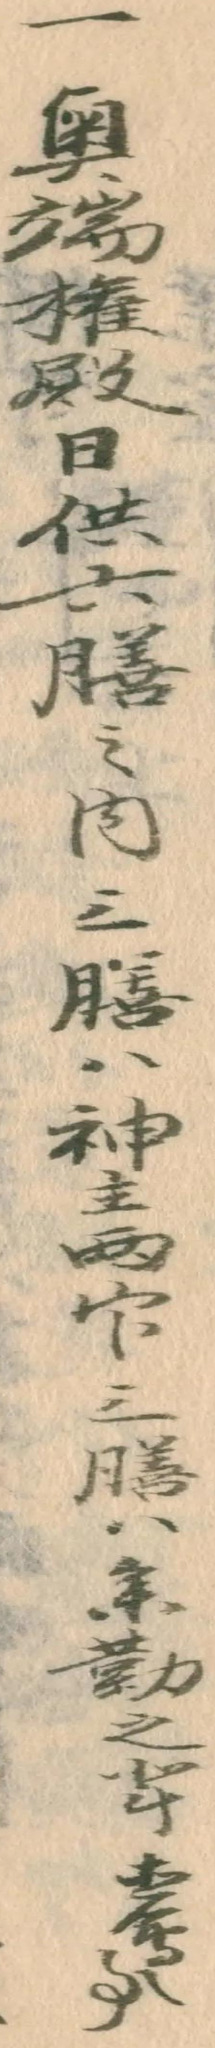一奥端権殿日供六膳之内三膳ハ神主両官三膳ハ参勤之輩直会之事
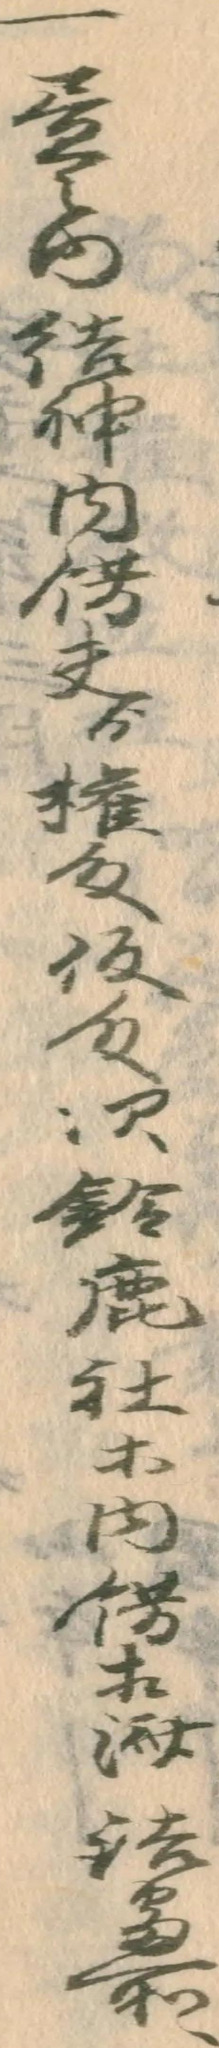一昼之内結神内飾夫ゟ権殿仮殿次鈴鹿社等内飾相済詰番所へ
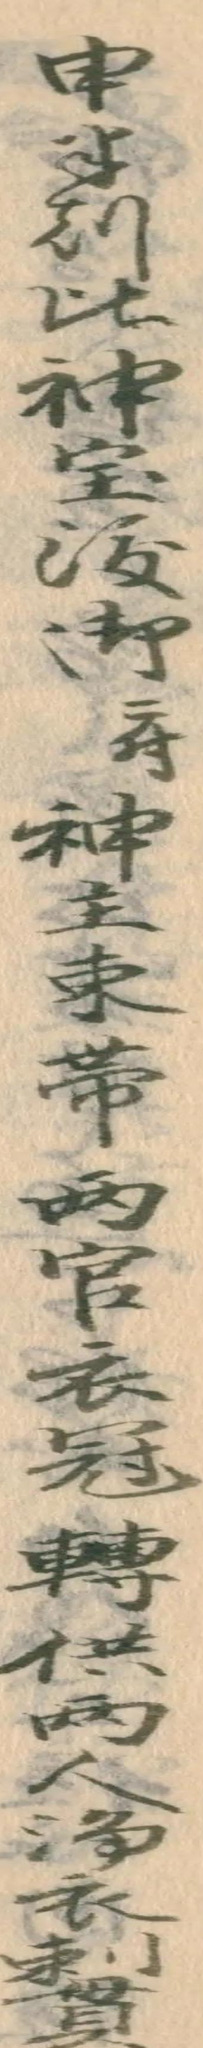一申半刻比神宝渡御ニ付神主束帯両官衣冠転供両人浄衣刺貫
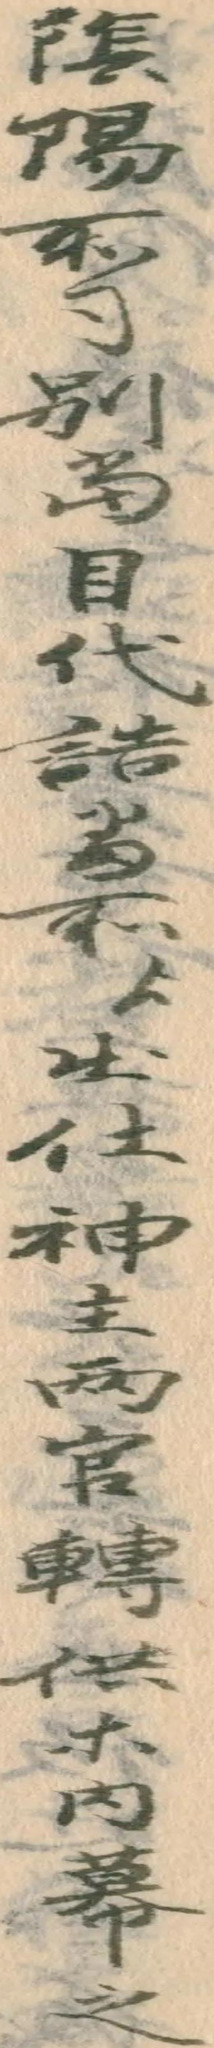陰陽所司別当目代詰番所ゟ出仕神主両官転供等内幕之
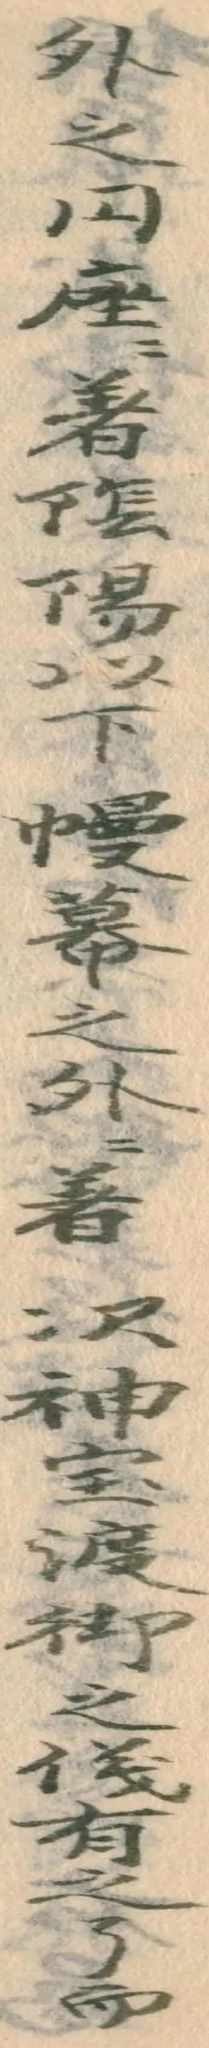外之円座ニ着陰陽以下幔幕之外ニ着次神宝渡御之儀有之了而
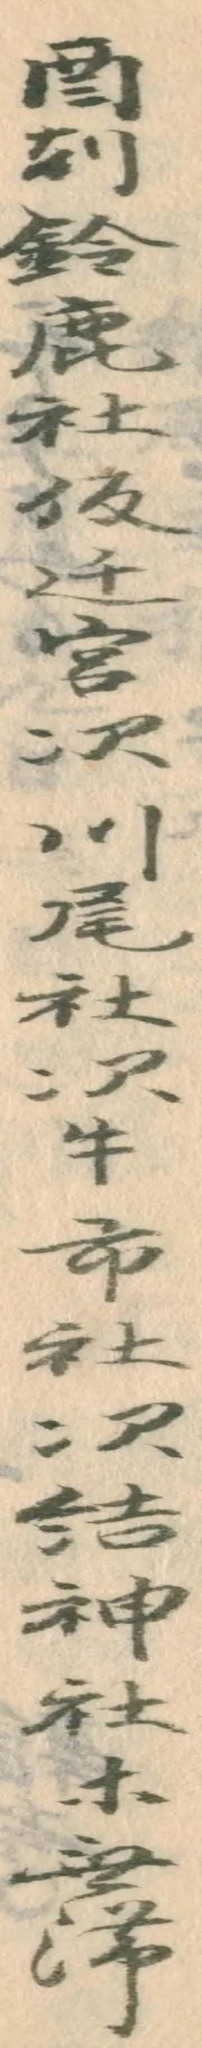一酉刻鈴鹿社仮迁宮次川尾社次牛市社次結神社当無滞
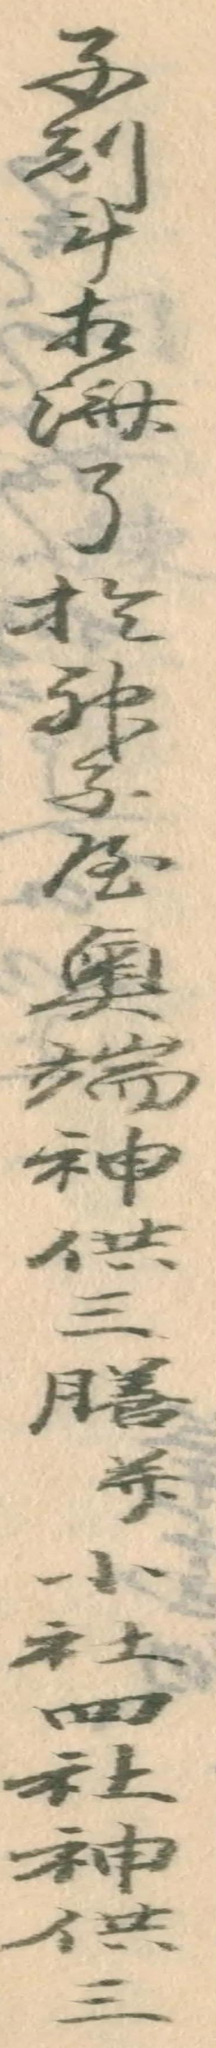子刻計相済了於神子屋奥端神供三膳并小社四社神供三
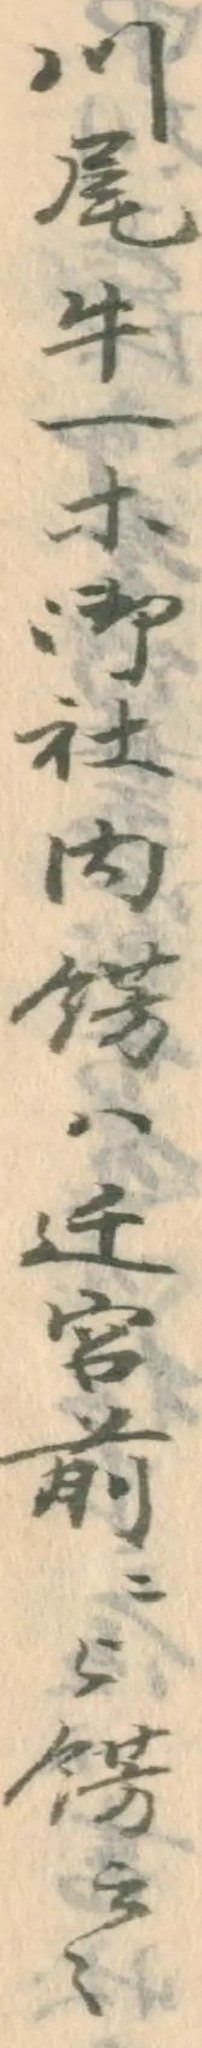川尾牛一等御社内飾ハ迁宮前ニ被飾云々

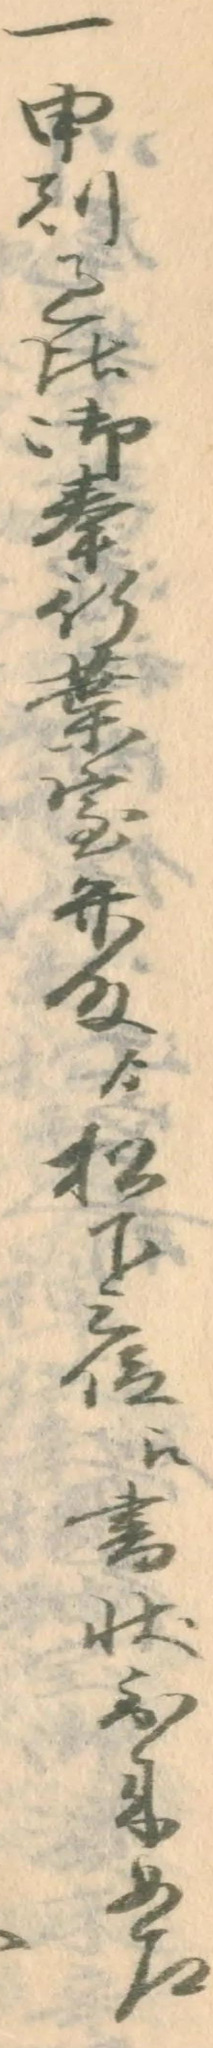一申刻過比御奉行業室弁殿ゟ松下三位江書状到来如左
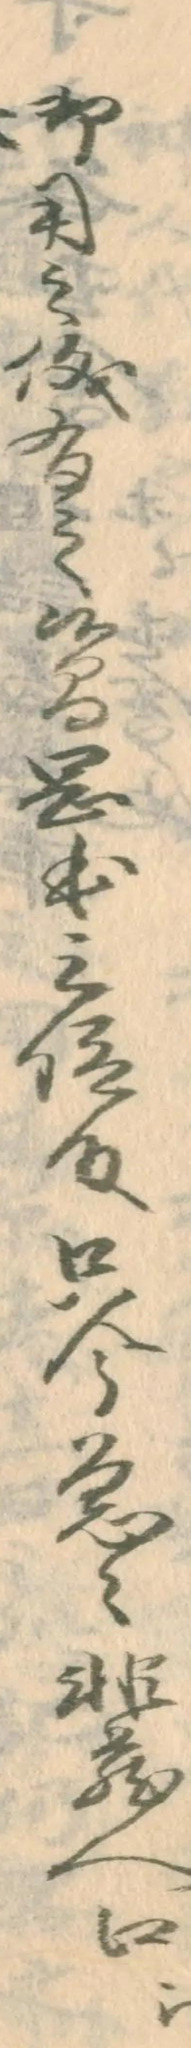御用之儀有之候間岡本三位殿只今急々非蔵人口江
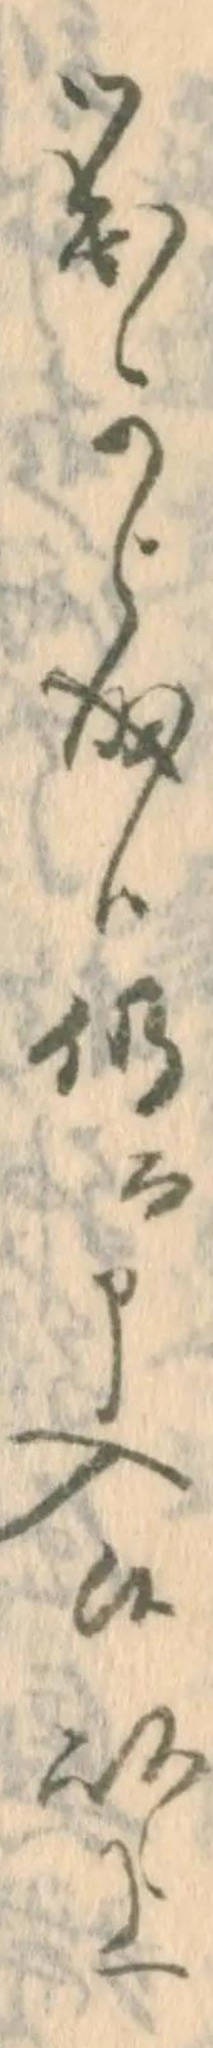御出可被成候仍而申入候以上
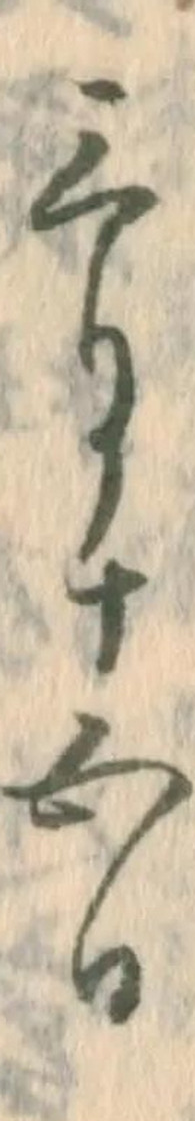三月十九日
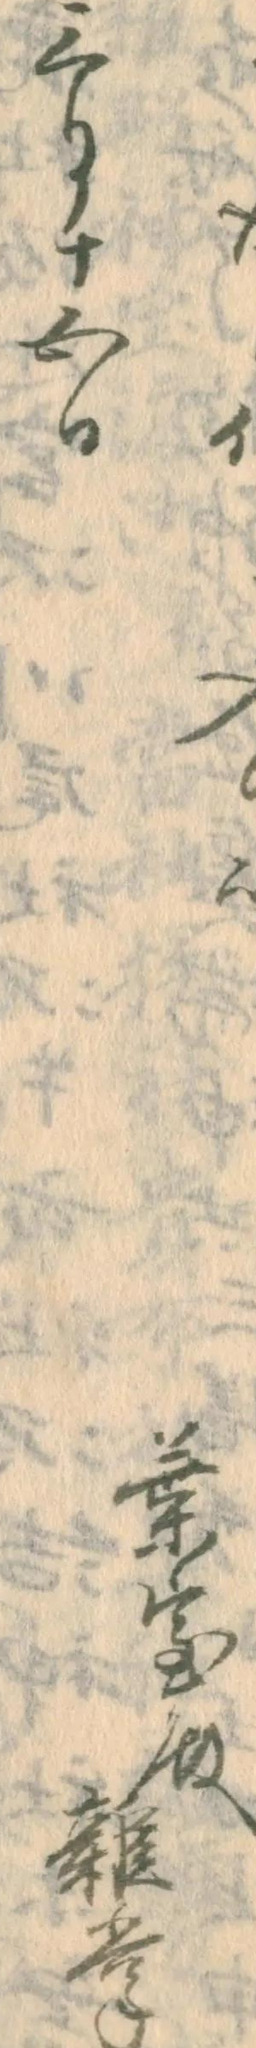三月十五日葉室殿
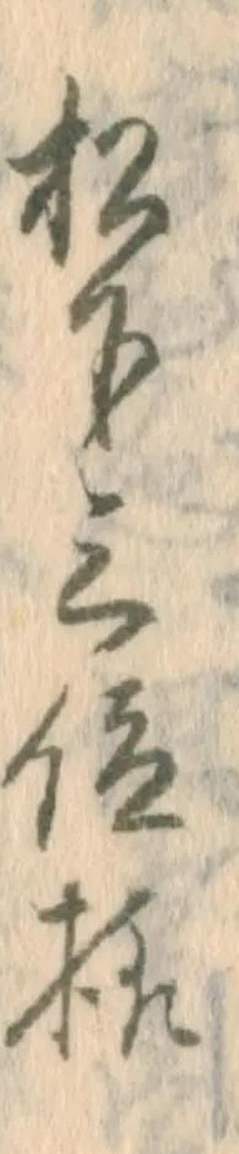松下三位様
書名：賀茂社記録. 第17冊
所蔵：国立国会図書館 National Diet Library, JAPAN
